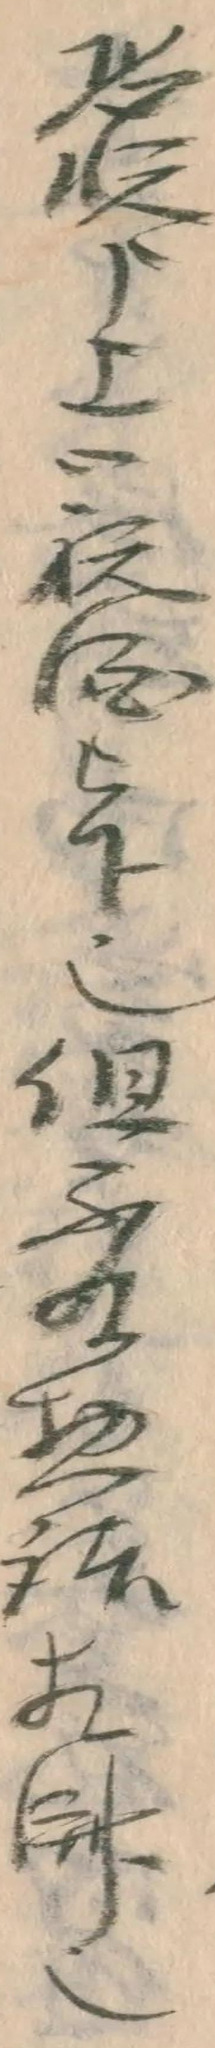恐悦申上御祝酒被下也但不及惣詰相済也
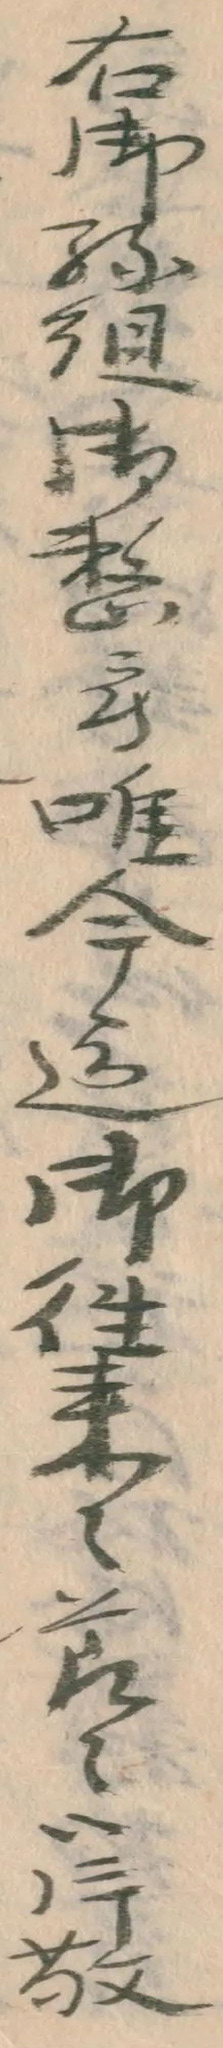右御縁組御整ニ付唯今迄御往来之節々ハ片敬
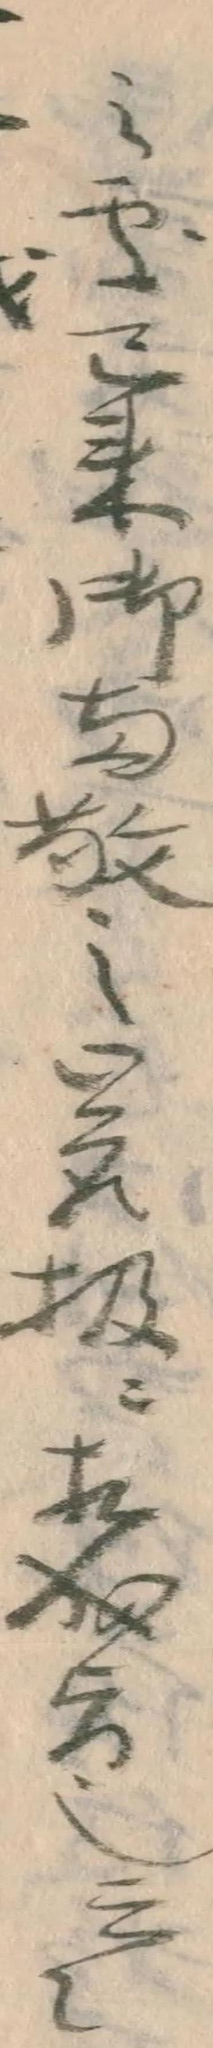之處已来御両敬之御取扱ニ相成旨也云々
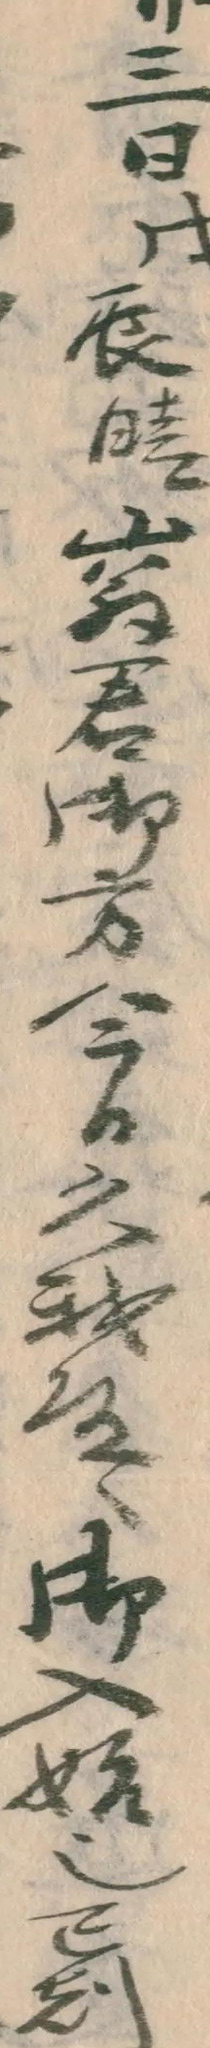廿三日戊辰晴嵡君御方今日久我殿へ御入始也巳刻
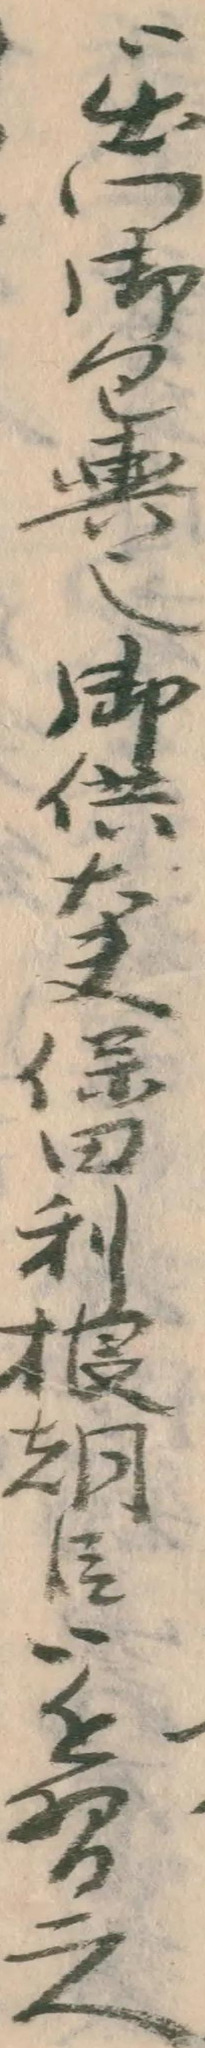御出門御包輿也御供大夫保田利根朝臣御近習二人
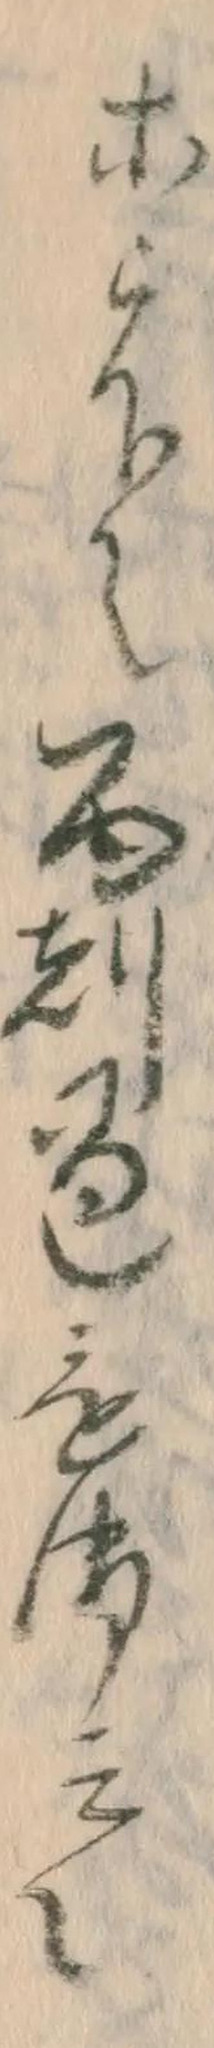等被下也酉刻過進御云々
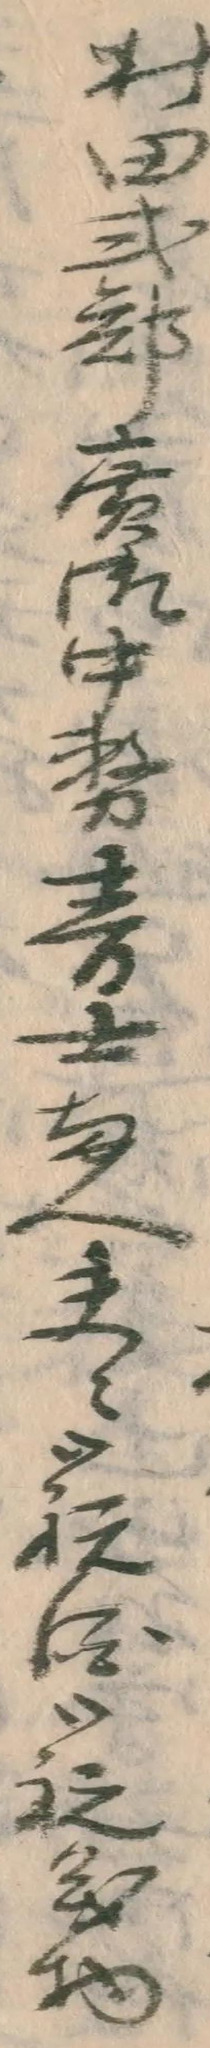村田式部廣御中務青士両人夫々御悦御祝義物
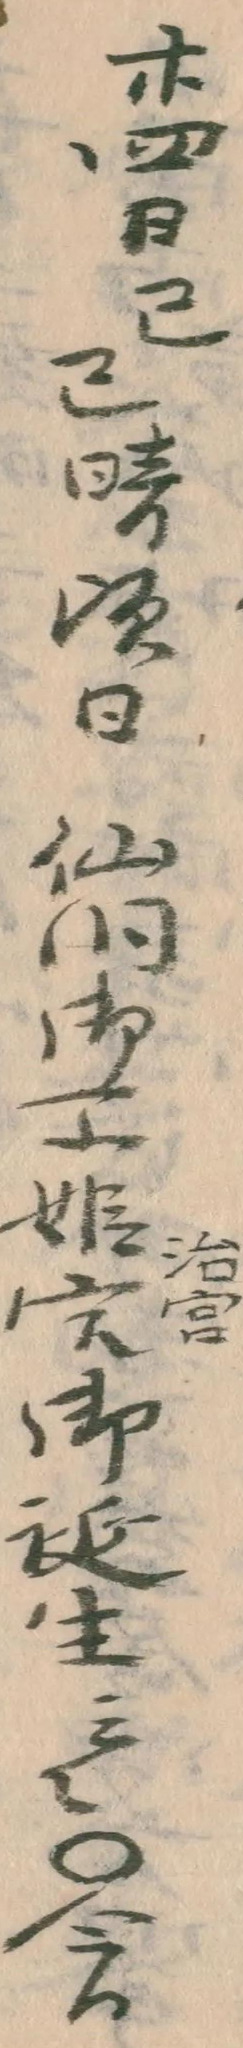廿四日己巳晴頃日仙洞御所姫宮御誕生云々○今日
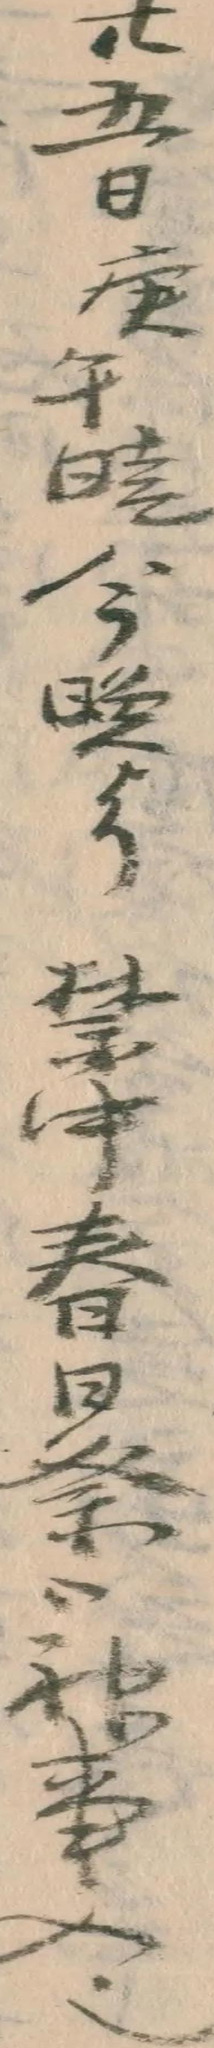廿五日庚午晴今晩より禁中春日祭御神事入也
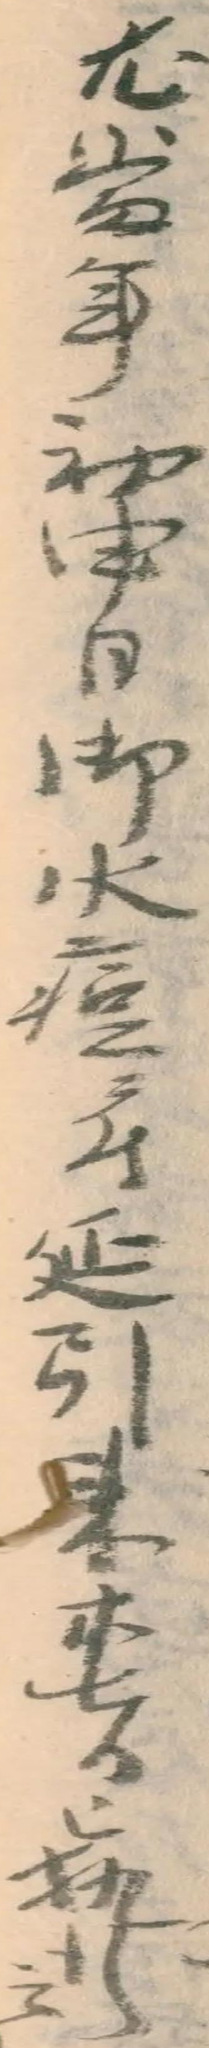尤當年初申日御水痘ニ付延引来廿七日被成候
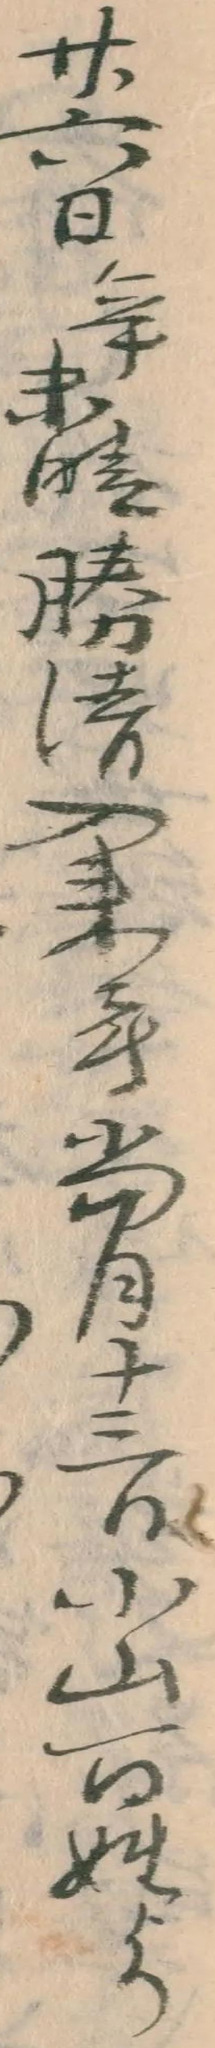廿六日辛未晴勝清入来ニ付當月十三日小山百姓より
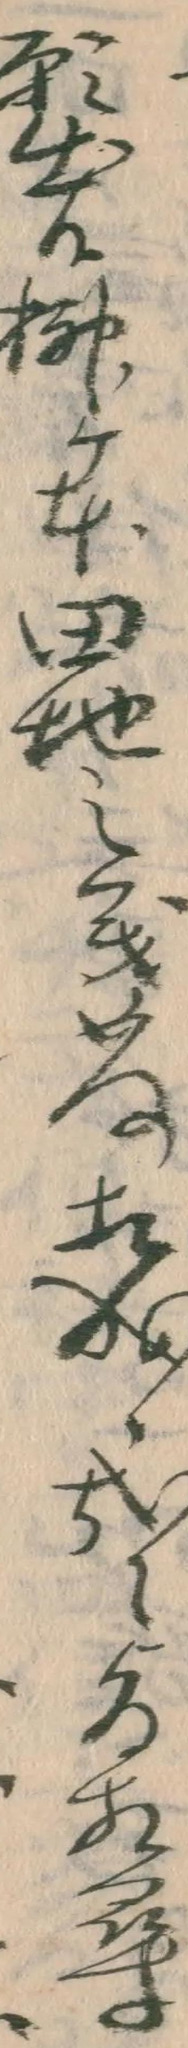願出候榊ヶ本田地之義如何相成候哉之旨相尋
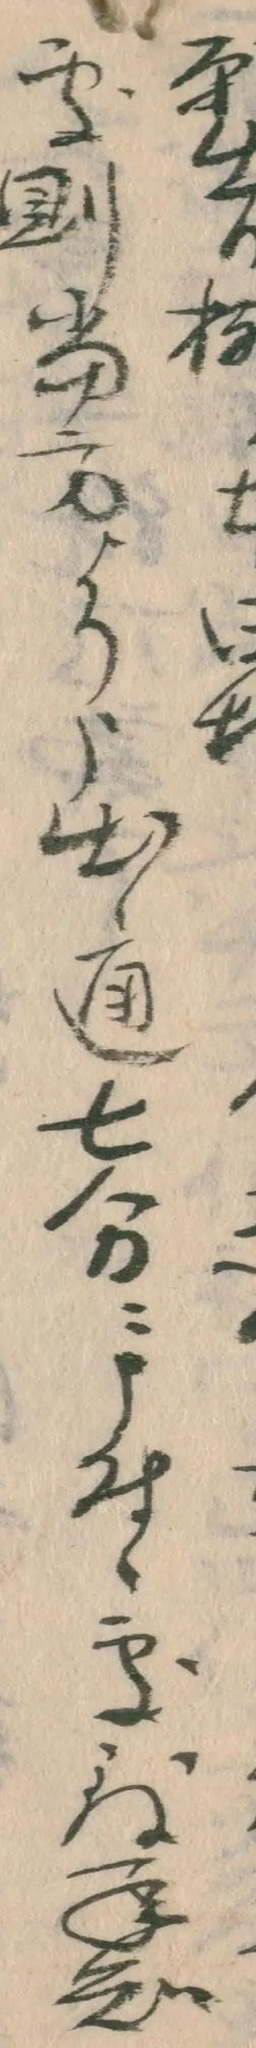處処則當方より申出候通七分ニ申付候處致承知
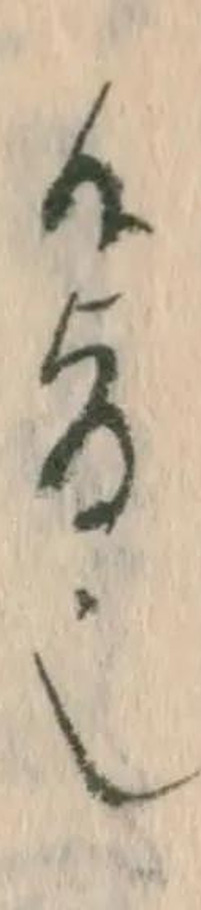候旨也
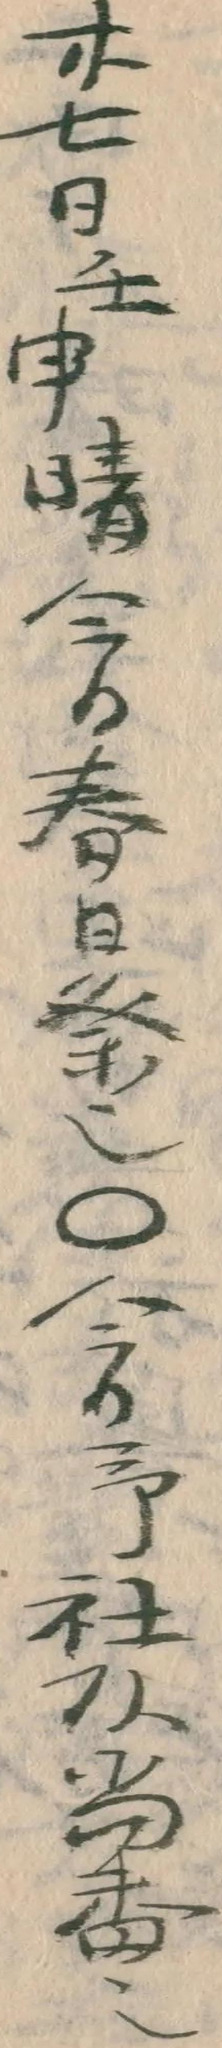廿七日壬申晴今日春日祭也○今日予社頭當番也
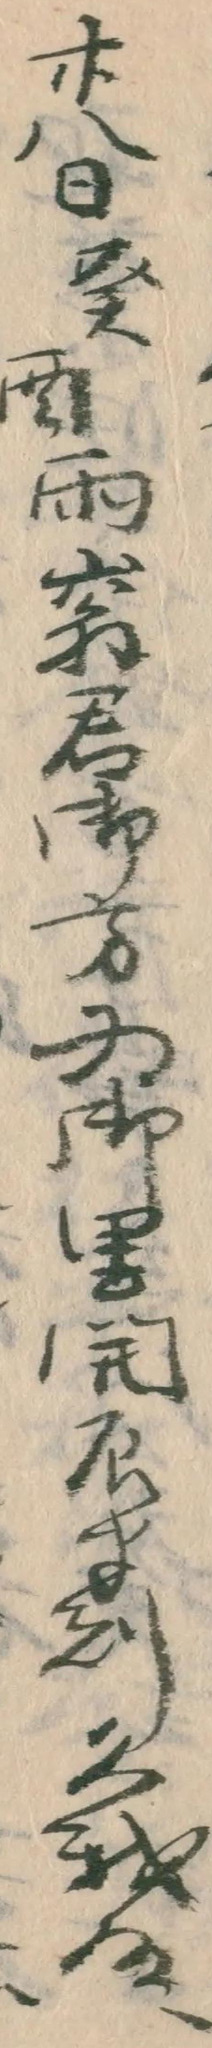廿八日癸酉雨嵡君御方為御里開辰半刻久我殿へ
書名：賀茂社記録. 第63冊
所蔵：国立国会図書館 National Diet Library, JAPAN
